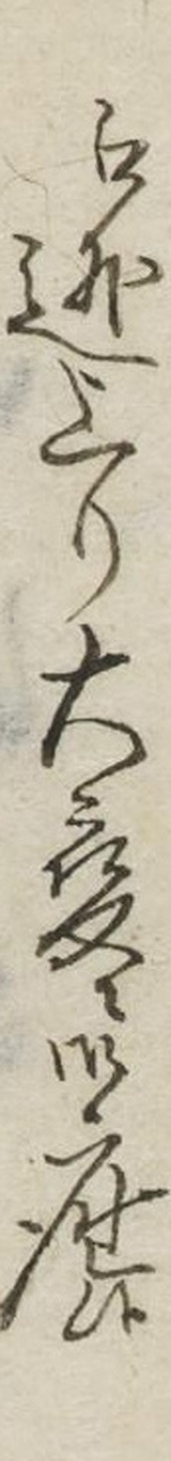え逃上り大変ニ御座候
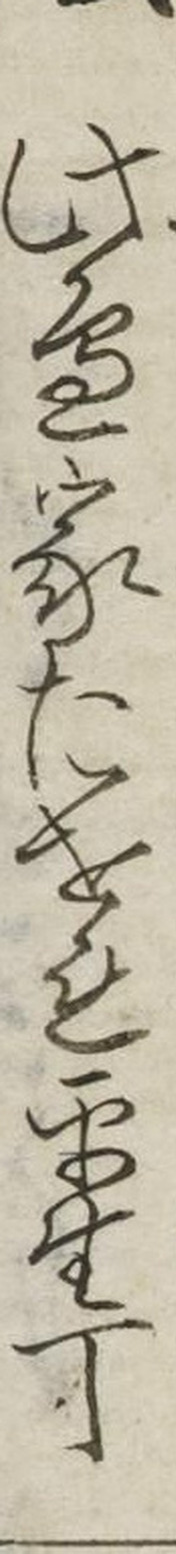此辺家たをれ平生丁
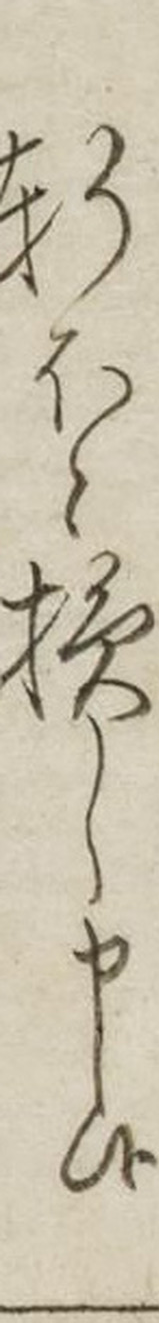ほと損じ申候
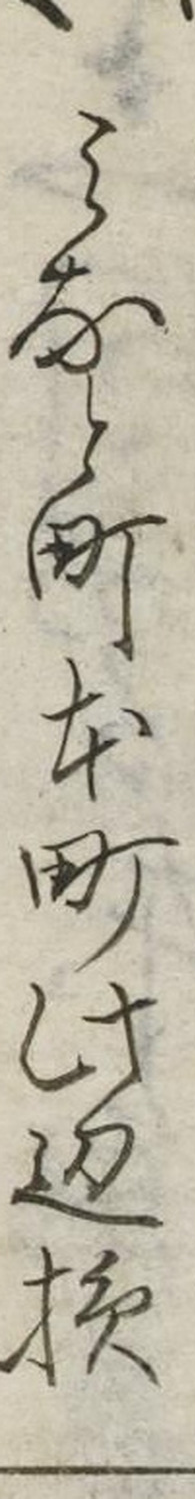ミなと町本町此辺損
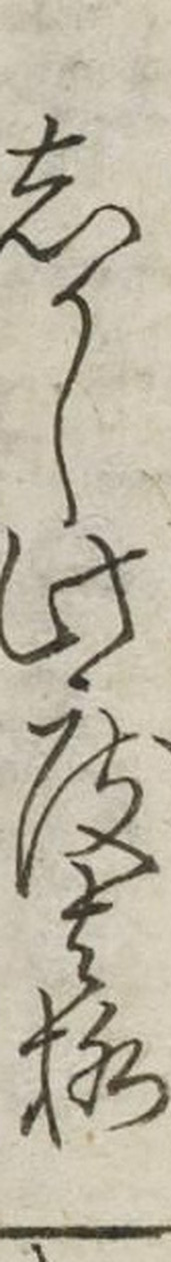しかし此度は格
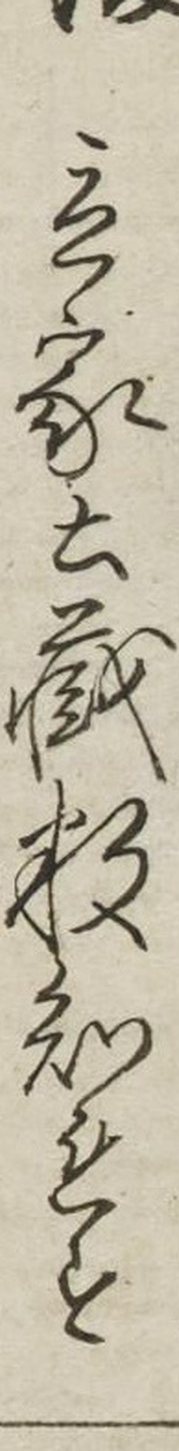立家土蔵数知れす
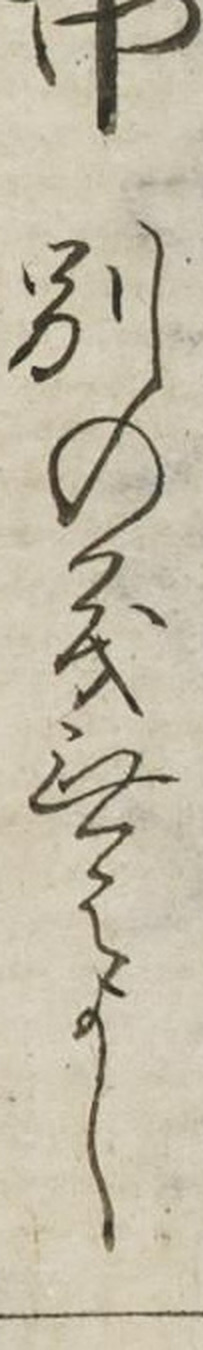別の義無之よし
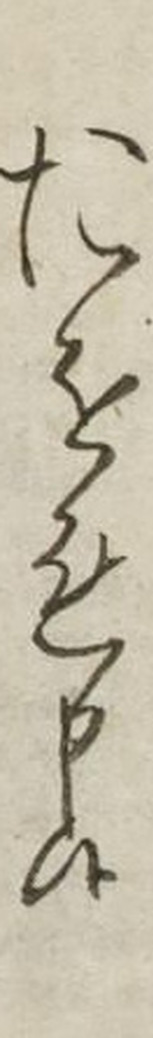たをれ申候
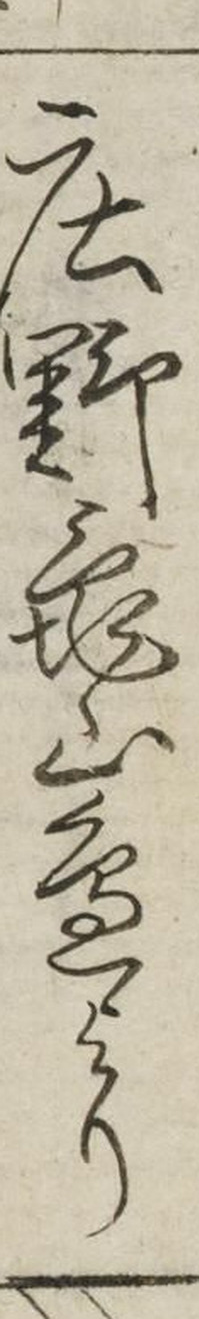庄野亀山辺ゟ
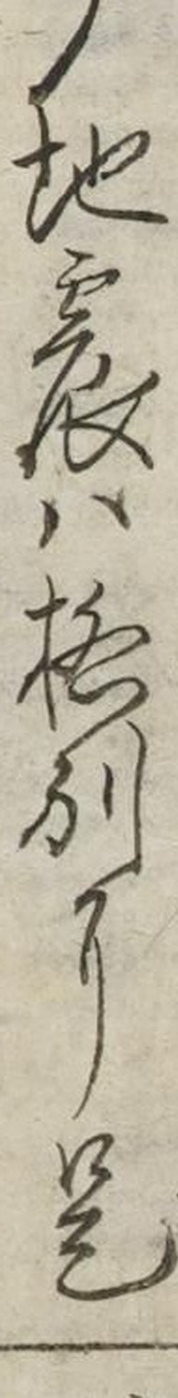地震ハ格別に是
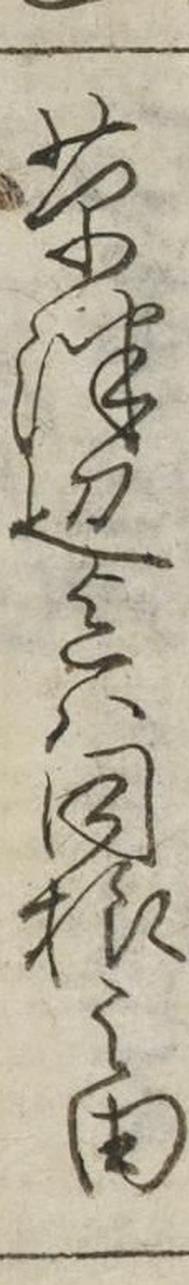草津辺迄ハ同様之由

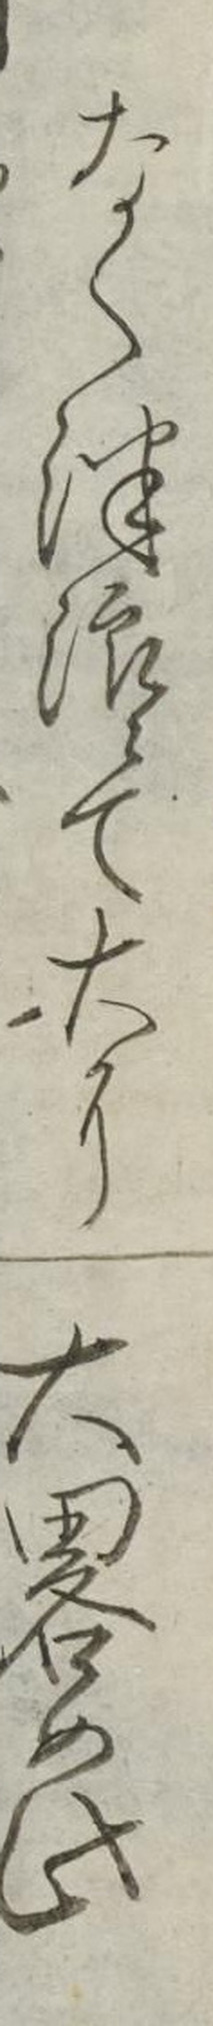鳥羽なく津浪ニて大に大略如此
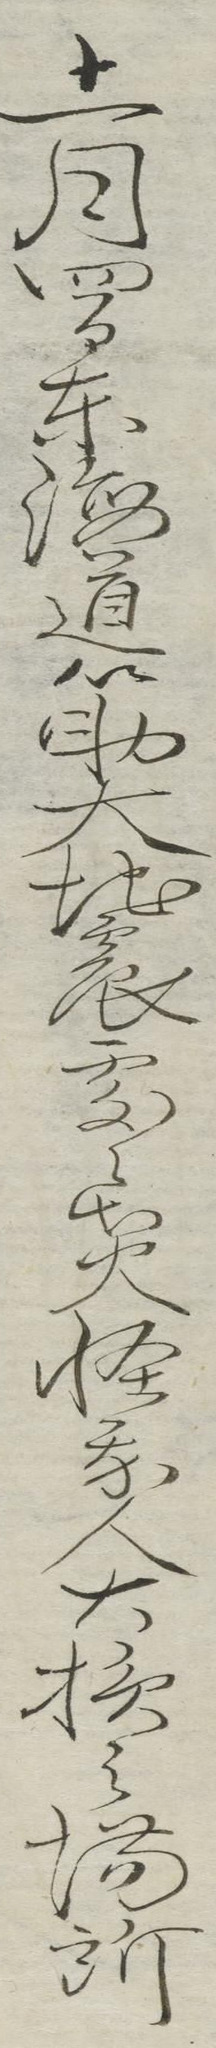十一月四日東海道筋大地震処々出火怪我人大損之場所

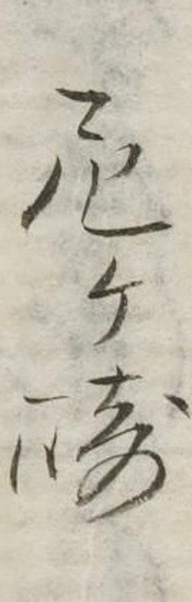尼ケ崎
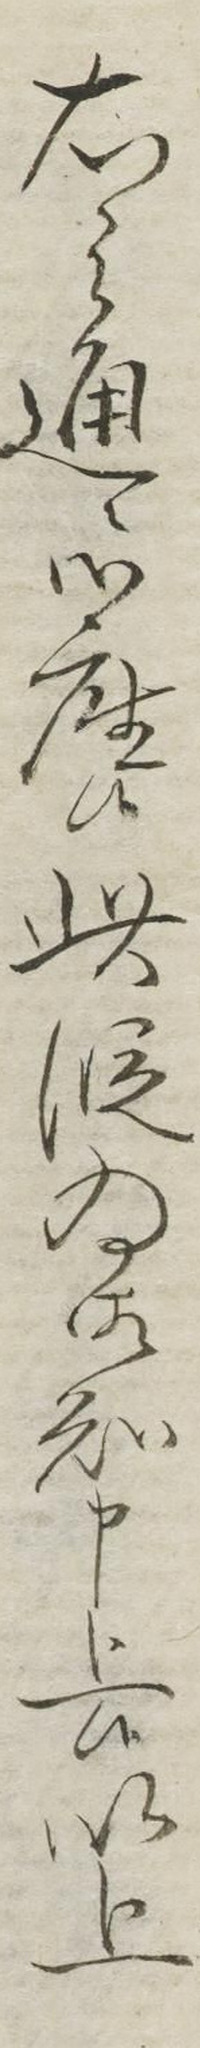右之通ニ御座候此段為御知申上候以上

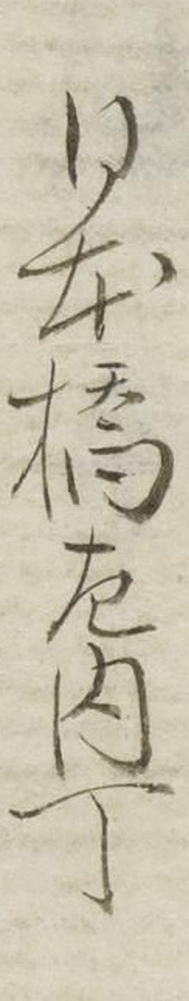日本橋左内丁
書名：大地震實録
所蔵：東京大学地震研究所図書室 Earthquake Research Institute Library, The University of Tokyo, JAPAN
